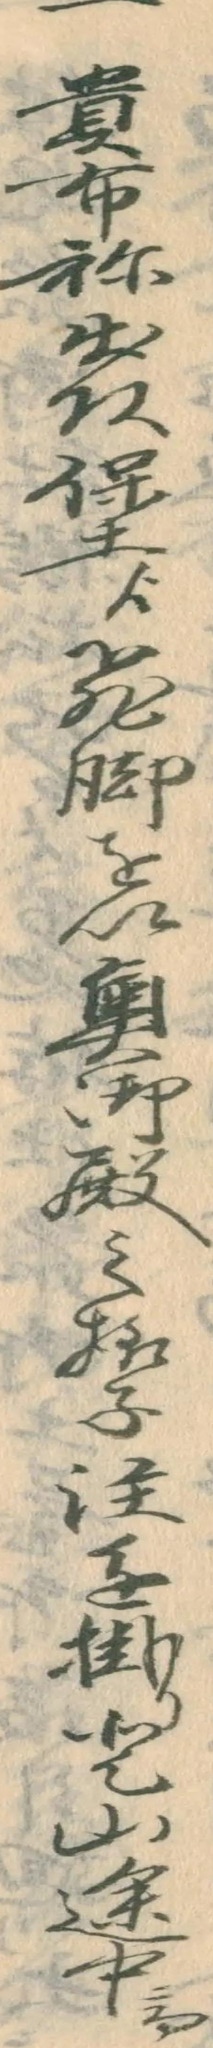一貴布祢出頭保土ゟ飛脚を以奥御殿之様子注進掛り登山途中ニ而

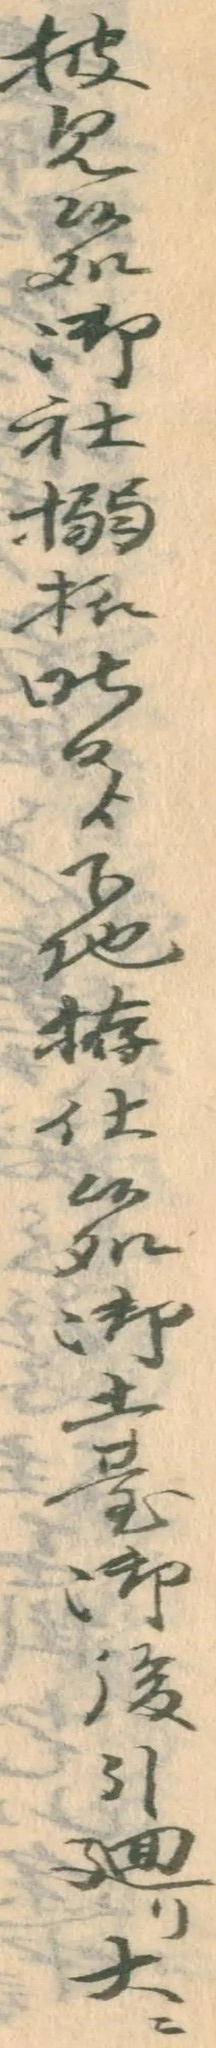披見候処御社搦様昨日ゟ下地拵仕候処土台御後引廻り大ニ
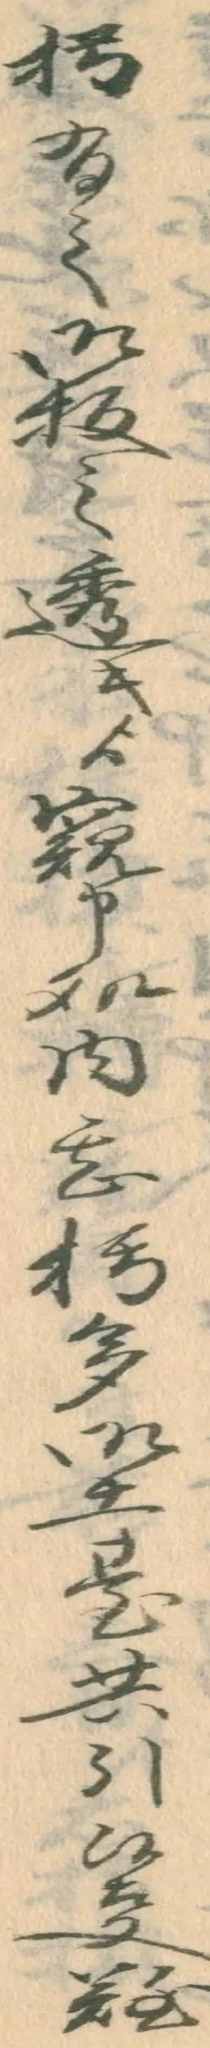朽有之御板之透キゟ窺申処内甚朽多御土台共引候事難
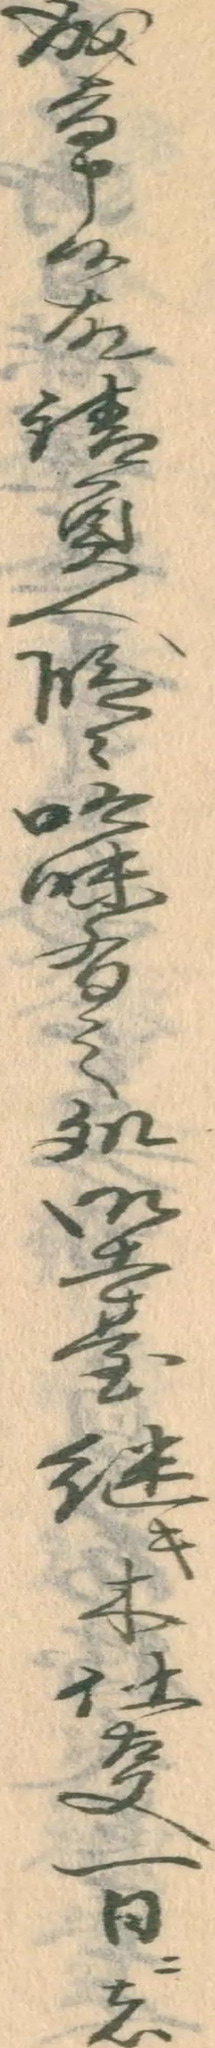成旨申候故請負人段々吟味有之処御土台継キ木仕事一日ニは
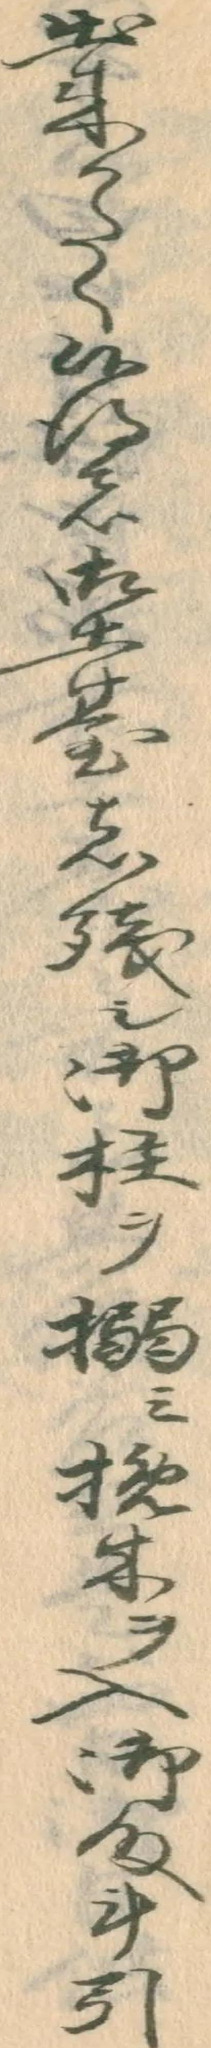出来かたく候得は御土台は残シ御柱ヲ搦ミ挽木ヲ入御殿計引
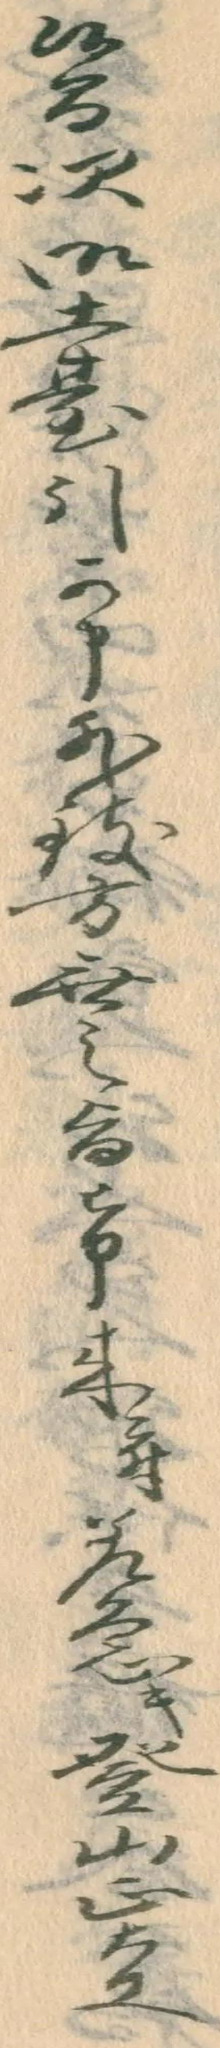候間次御土台引可申外致方無之旨被申来ニ付差急キ登山正大工
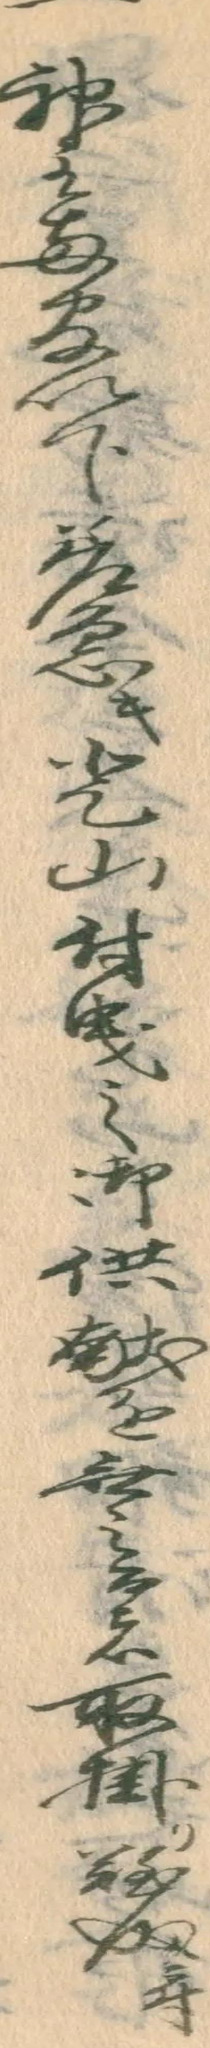一神主両官以下差急キ登山付曳之御供献進無之而は取掛リ難成ニ付
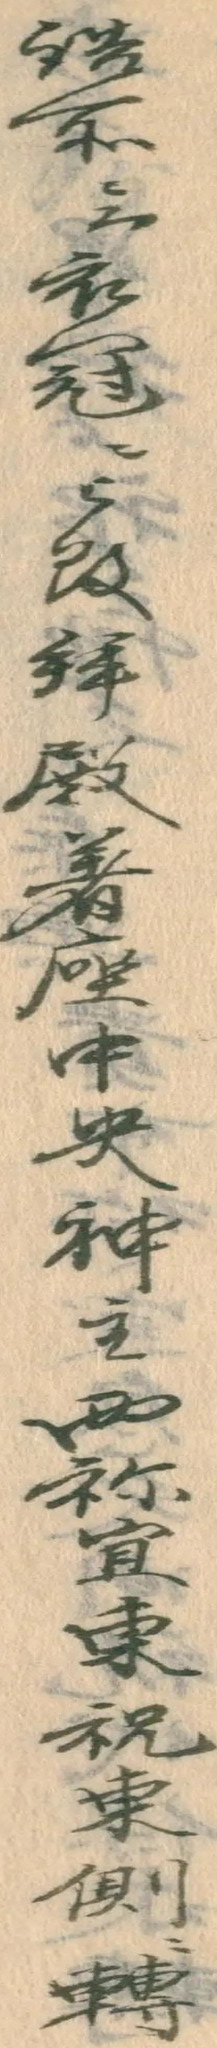詰所ニ而衣冠ニ被改拝殿着座中央神主西祢宜東祝東側ニ転
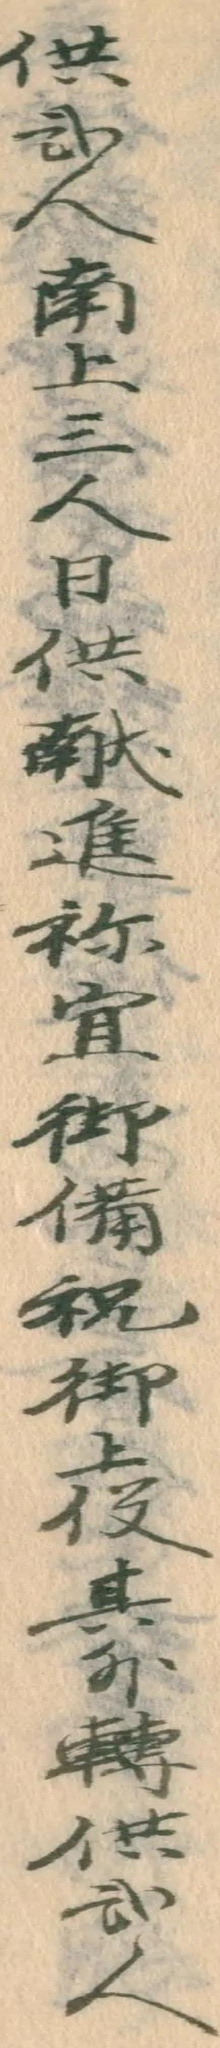供弐人南上三人日供献進祢宜御備祝御上役其外轉供弐人
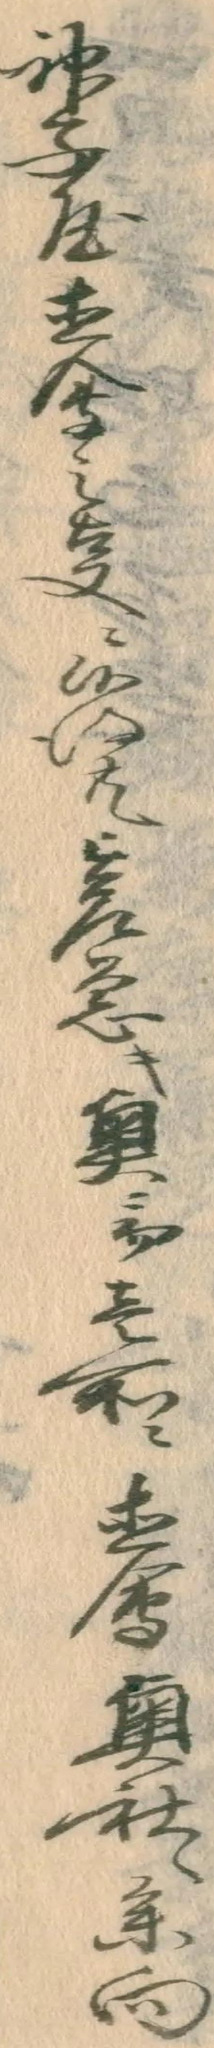神子屋直会之事ニ候得共差急キ奥ニ而壱所ニ直会奥社ヘ参向
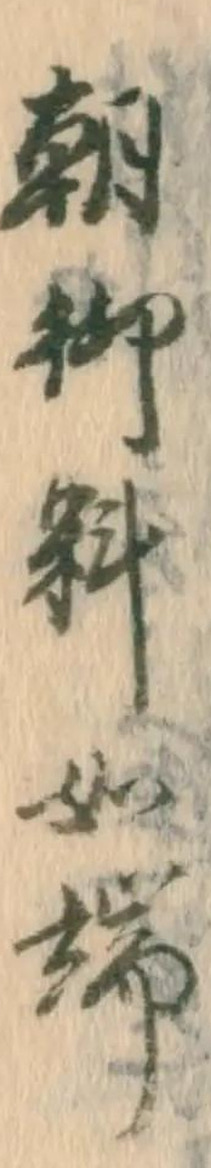朝御料如端
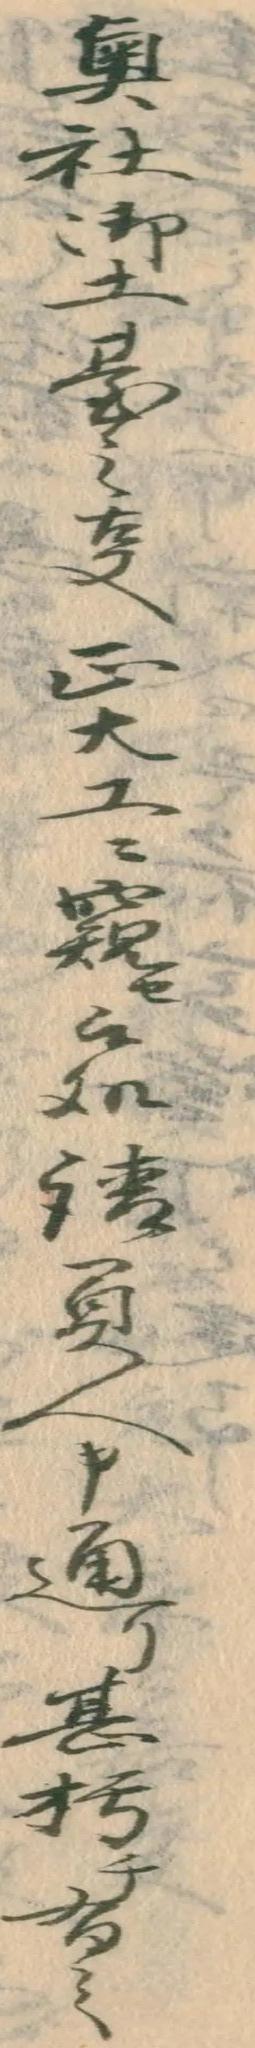一奥社御土台之事正大工ニ窺セ候処請負人申通り甚朽テ有之
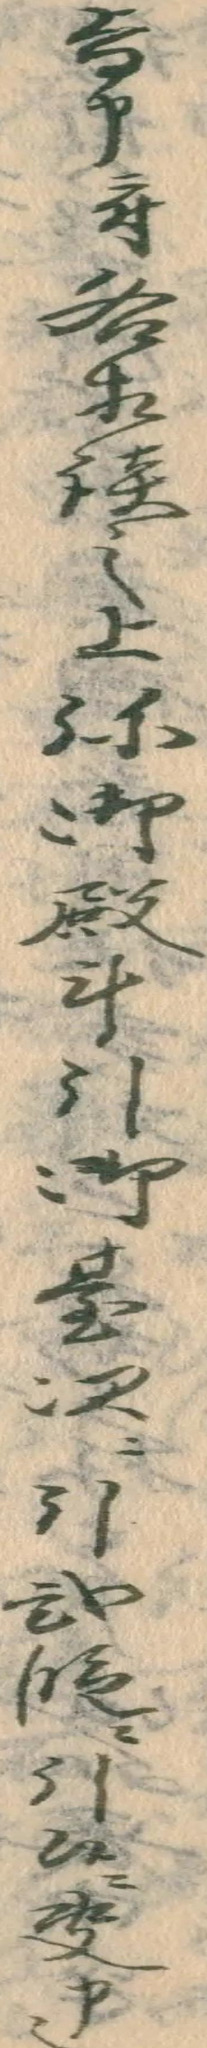旨申ニ付各相談之上弥御殿計引御台次ニ引弐段ニ引候ニ決申也
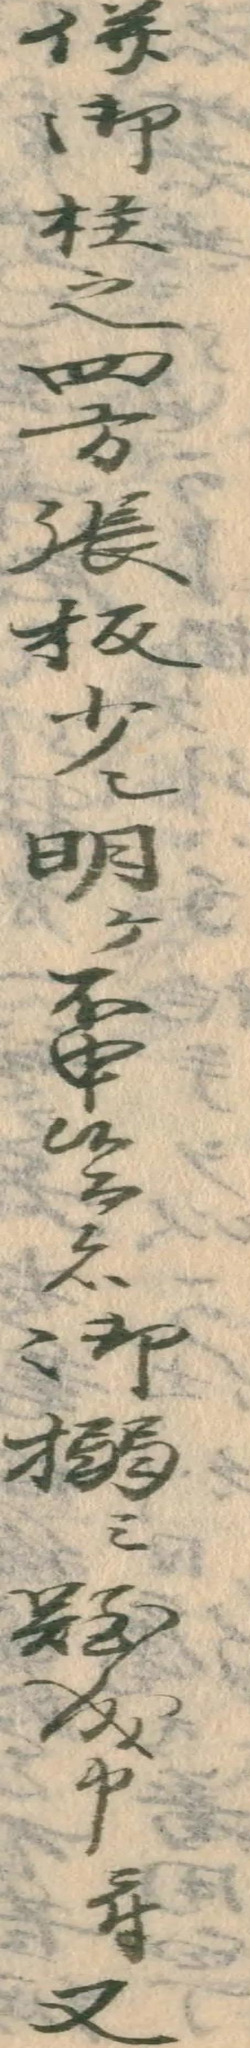倂御柱之四方張板少シ明ケ不申候而は御搦み難成申ニ付又
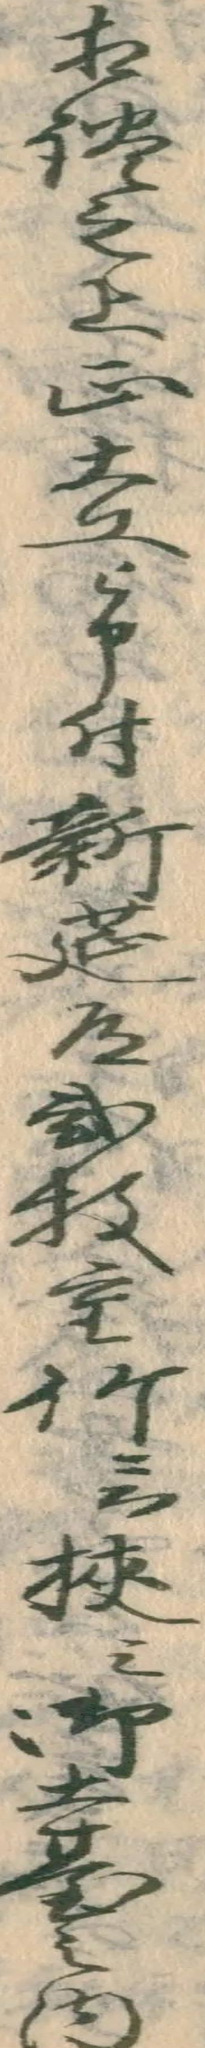相談之上正大工被申付新莚道弐枚重竹ニ而挟み御土台之内
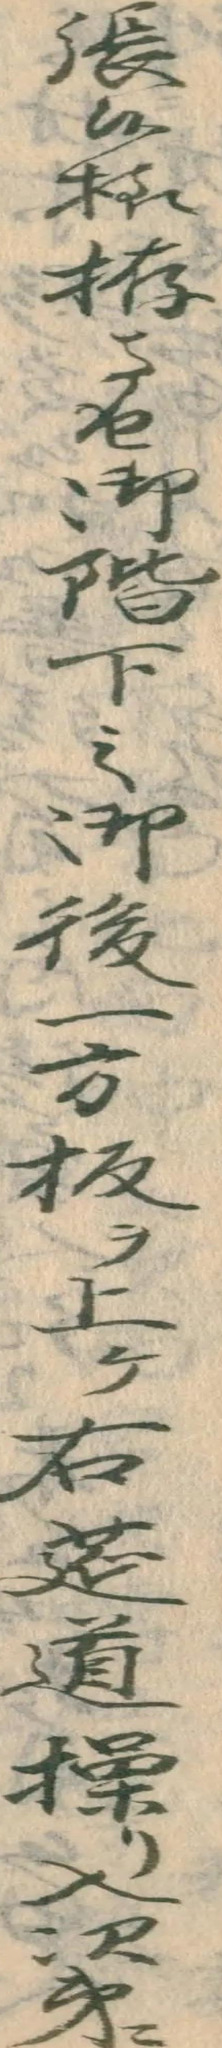張候様拵さセ御階下之御後一方板ヲ上ケ右筵道操リ入次第ニ
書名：賀茂社記録. 第17冊
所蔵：国立国会図書館 National Diet Library, JAPAN
